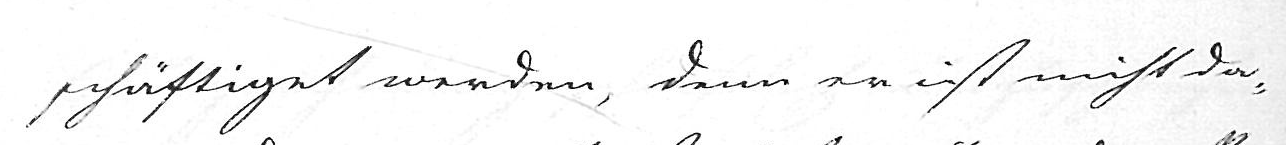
schäftiget werden, denn er ist nicht da-
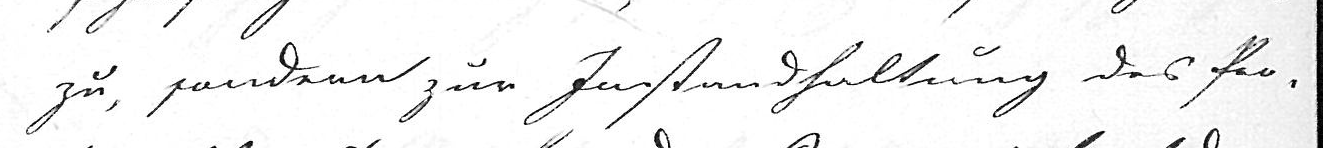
zu, sondern zur Instandhaltung des Pro-
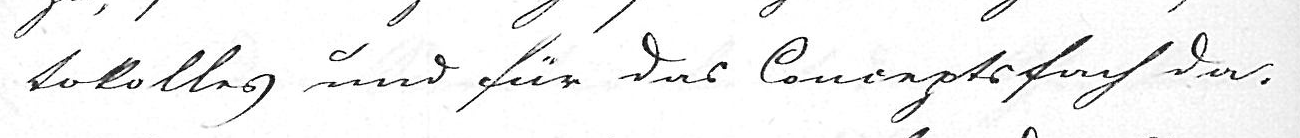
tokolles und für des Conceptsfach da.
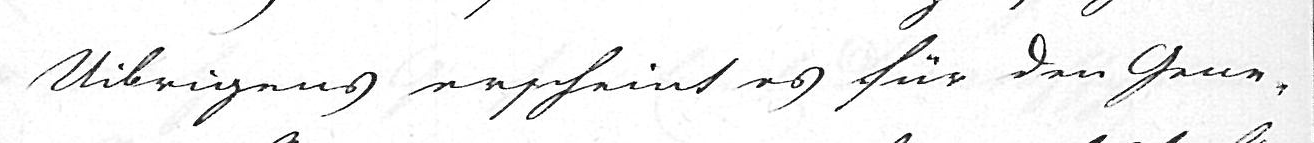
Uibrigens erscheint es für den Gene-
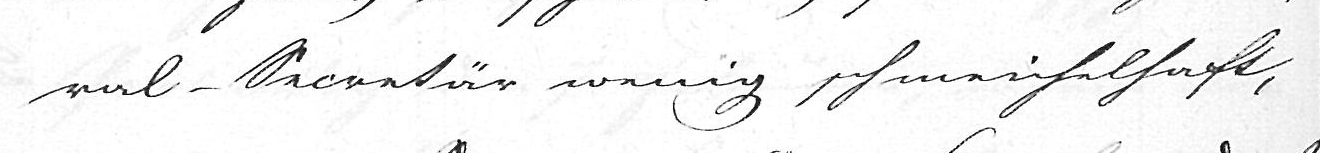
als-Secretär wenig schmeichelhaft,
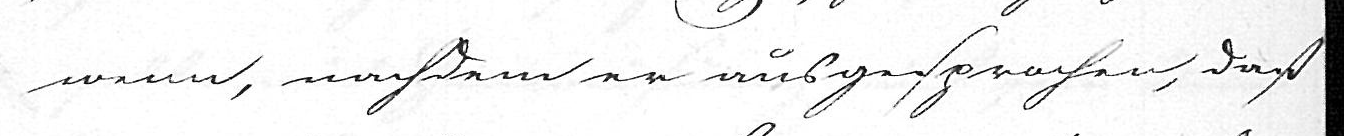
wenn, nachdem er ausgesprochen, daß
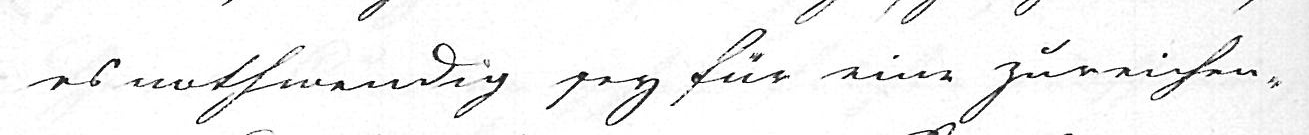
es nothwendig sey für eine zureichen-
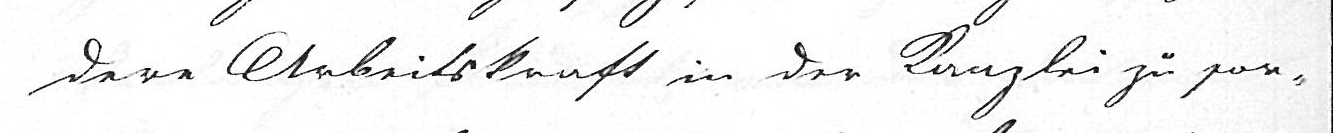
dere Arbeitskraft in der Kanzlei zu sor-
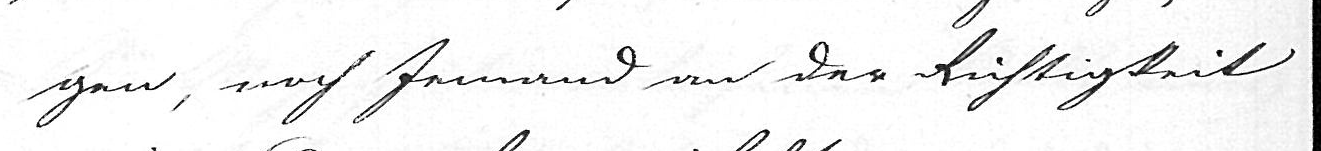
gen, noch jemand an der Richtigkeit
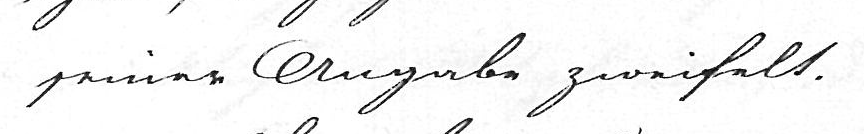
seiner Angabe zweifelt.
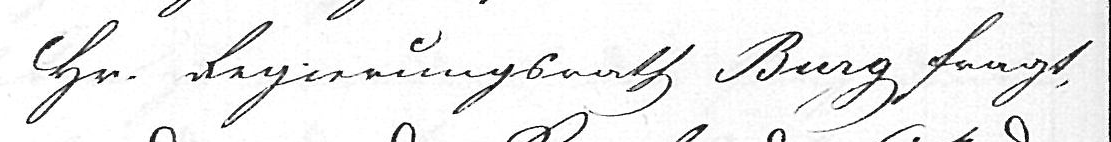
Hr. Regierungsrath Burg fragt,
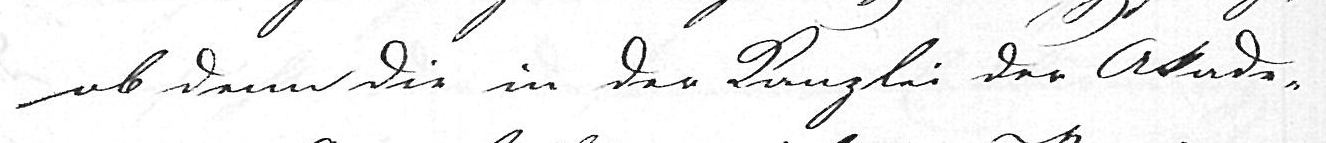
ob denn die in der Kanzlei der Akade-
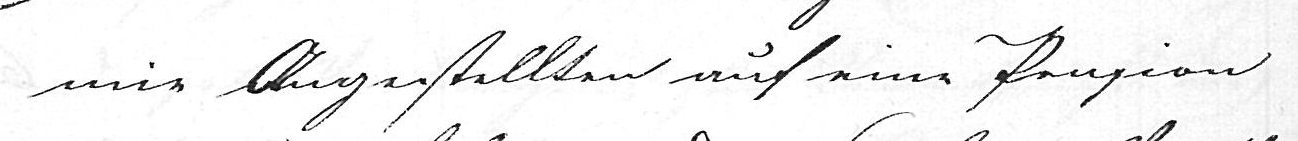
mie Angestellten auf eine Pension
